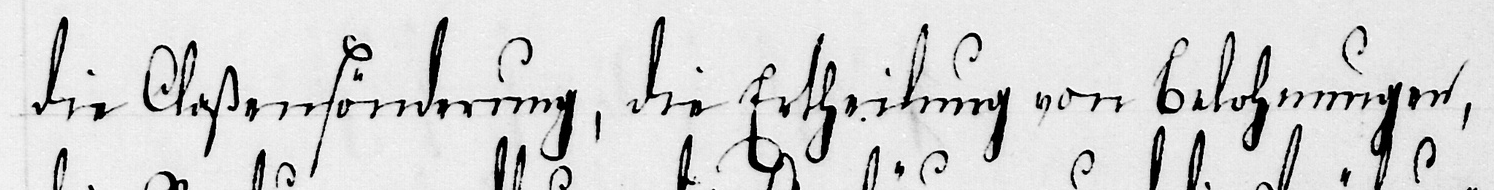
die Claßensönderung, die Ertheilung von Belohnungen,
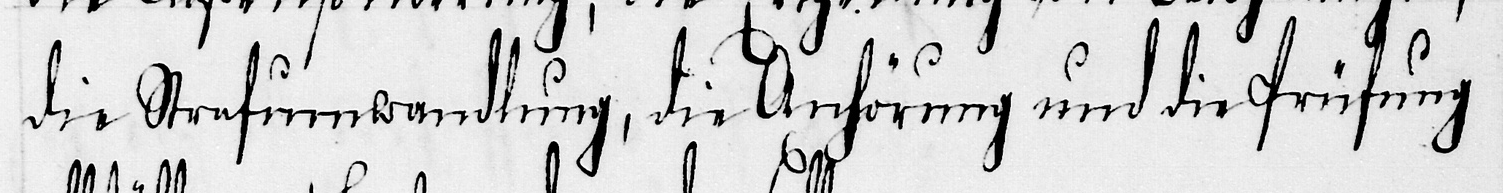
die Strafumwandlung, die Anhörung und die Prüfung
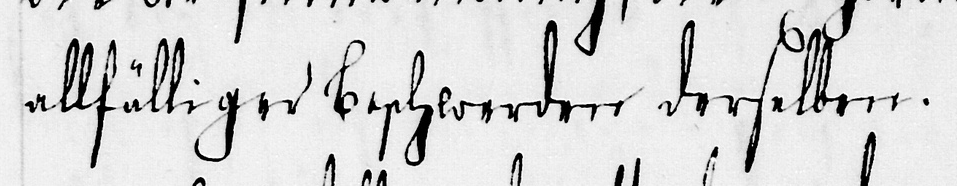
allfälliger Beschwerden derselben.
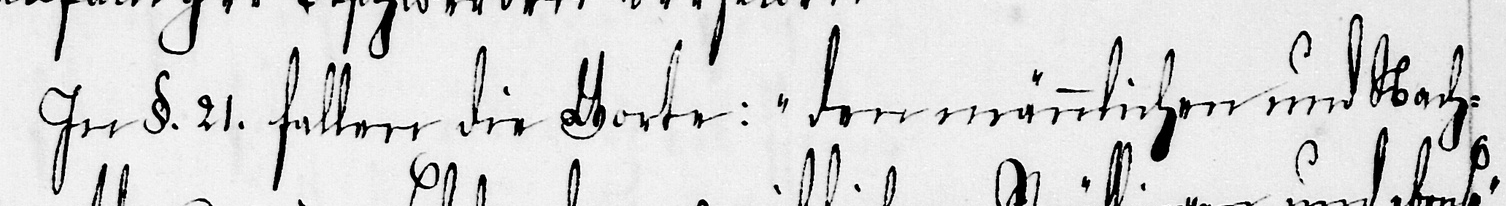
In §. 21. fallen die Worte: „den männlichen und Nach¬
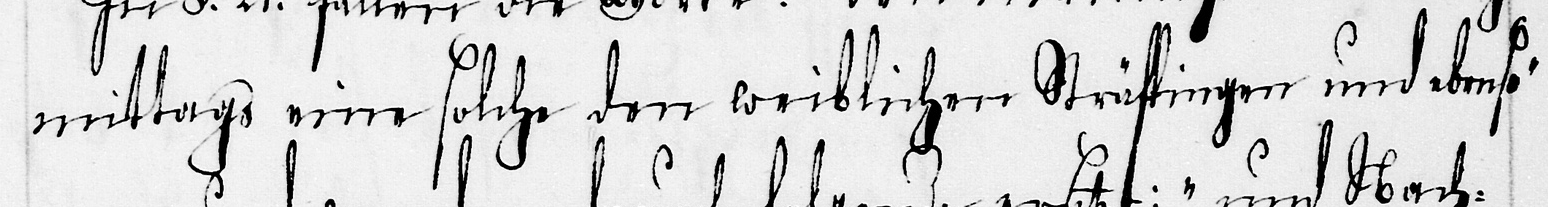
mittags eine solche den weiblichen Sträflingen und ebens¬
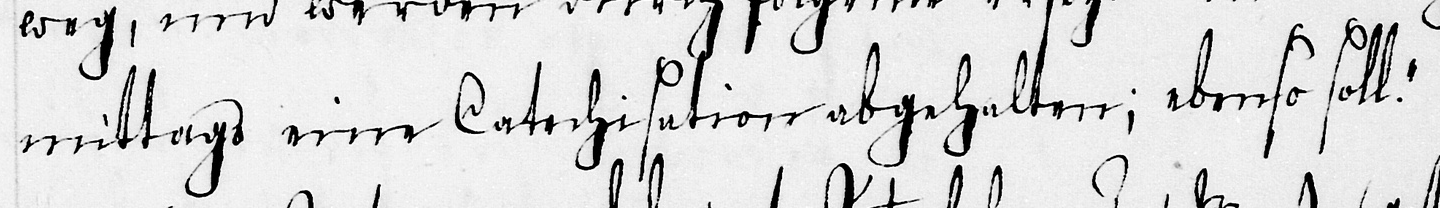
mittags eine Catechisation abgehalten; ebenso sol¬
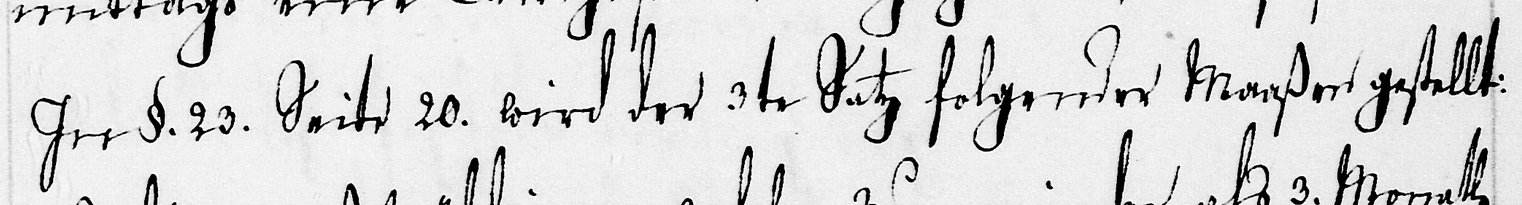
In §. 23. Seite 20. wird der 3te Satz folgender Maaßen gestellt:
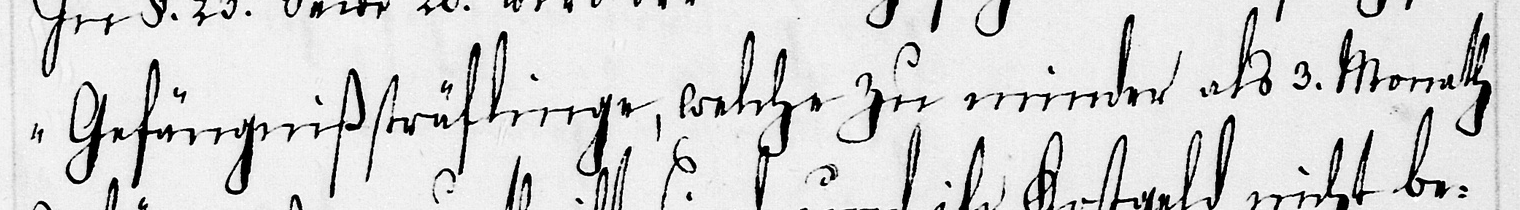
„Gefängnißsträflinge, welche zu minder als 3. Monath
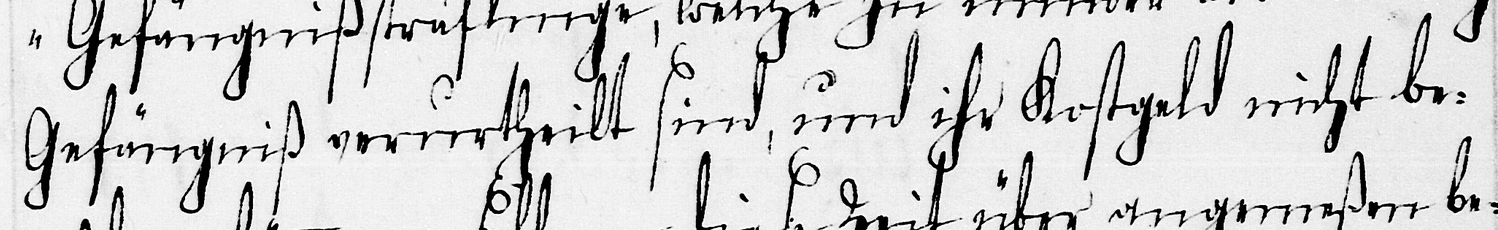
Gefängniß verurtheilt sind, und ihr Kostgeld nicht be¬
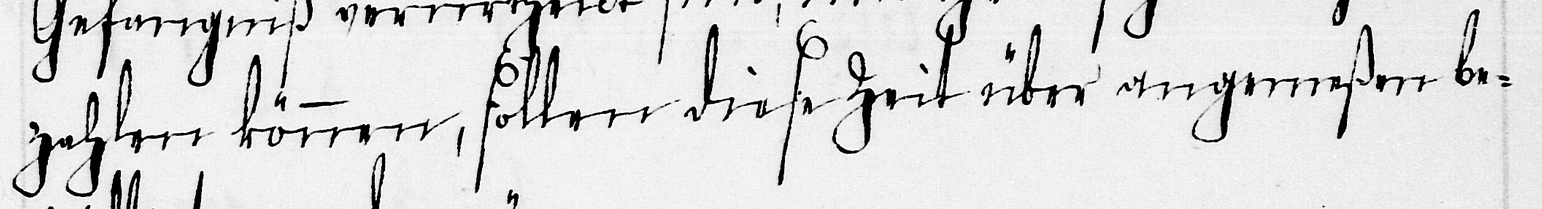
zahlen können, sollen diese Zeit über angemeßen be¬
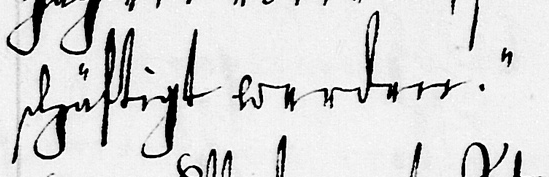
schäftigt werden.“
